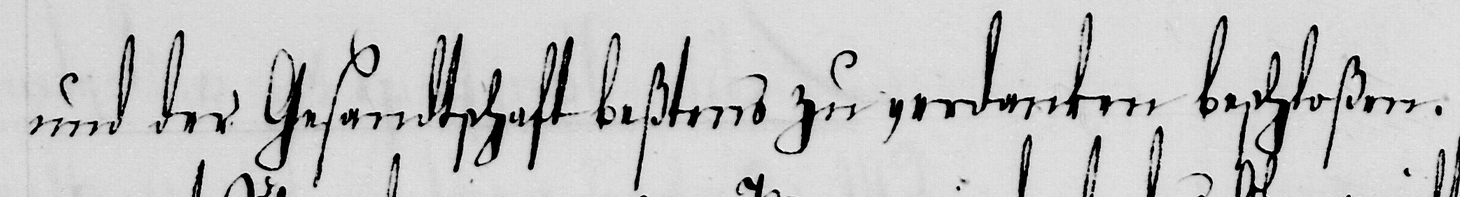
und der Gesandtschaft beßtens zu verdanken beschloßen.
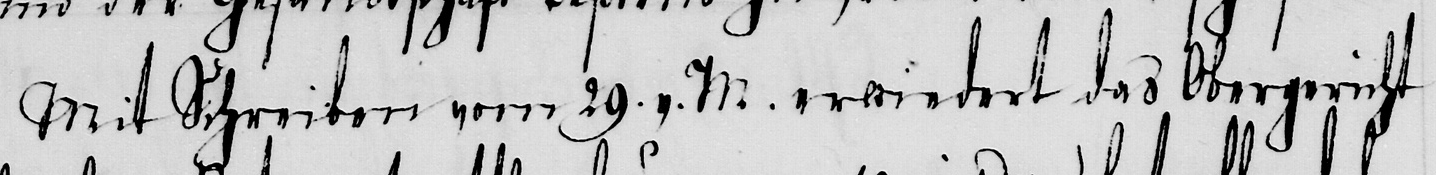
Mit Schreiben vom 29. v. M. erwiedert das Obergericht
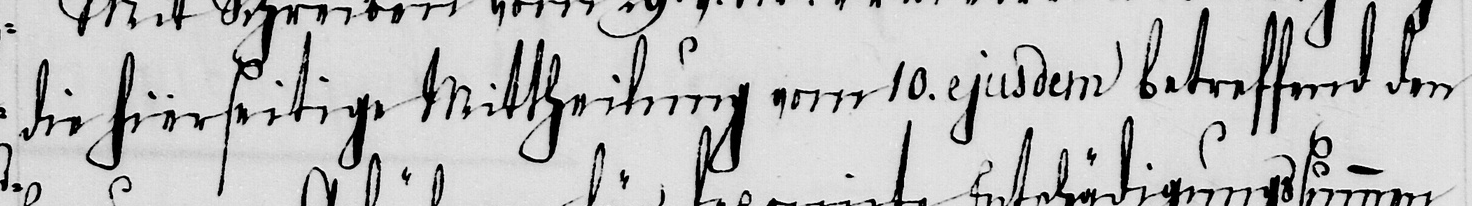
die hierseitige Mittheilung vom 10. ejusdem betreffend den
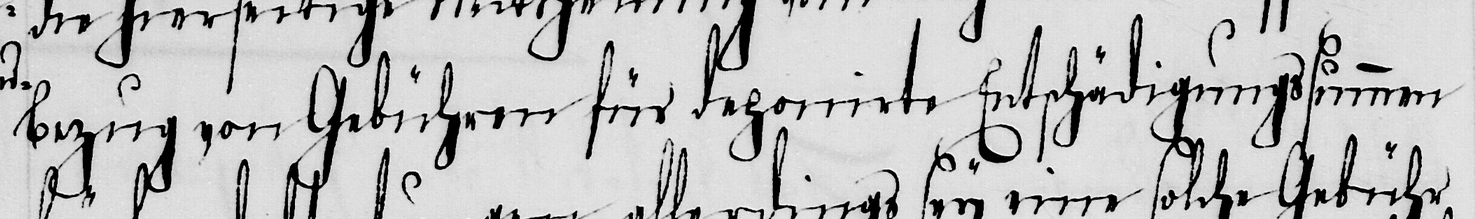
Bezug von Gebühren für deponirte Entschädigungssummen
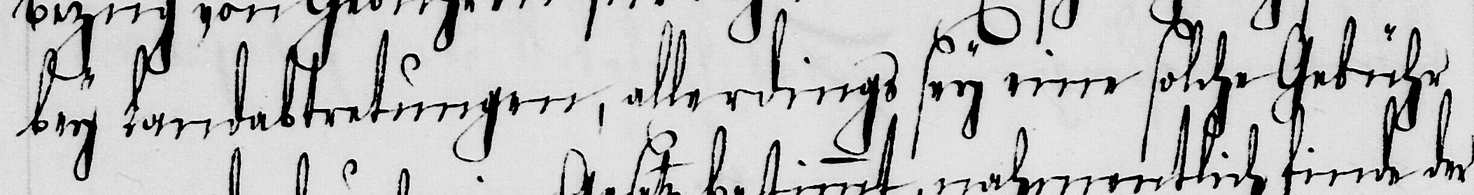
bey Landabtretungen, allerdings sey eine solche Gebühr
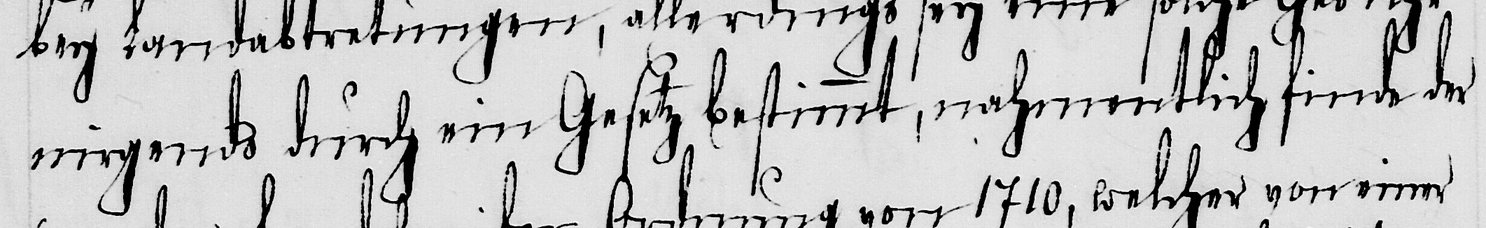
nirgends durch ein Gesetz bestimmt, nahmentlich finde der
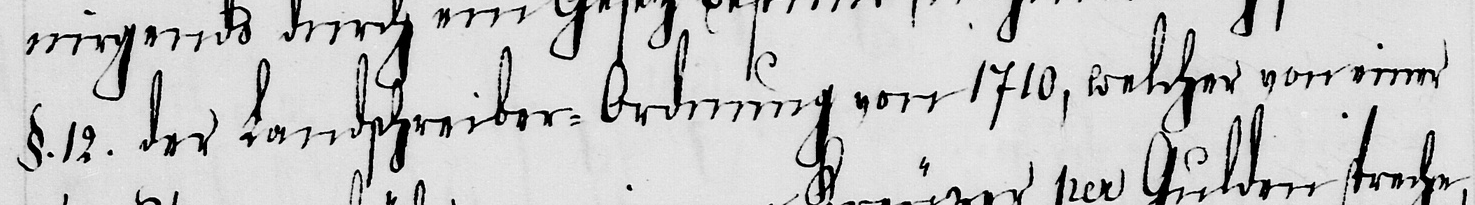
§. 12. der Landschreiber-Ordnung von 1710, welcher von einer
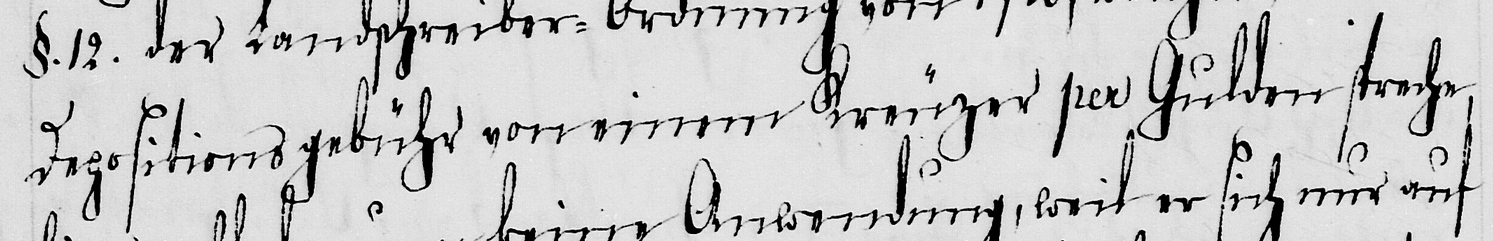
Depositionsgebühr von einem Kreuzer per Gulden spreche,
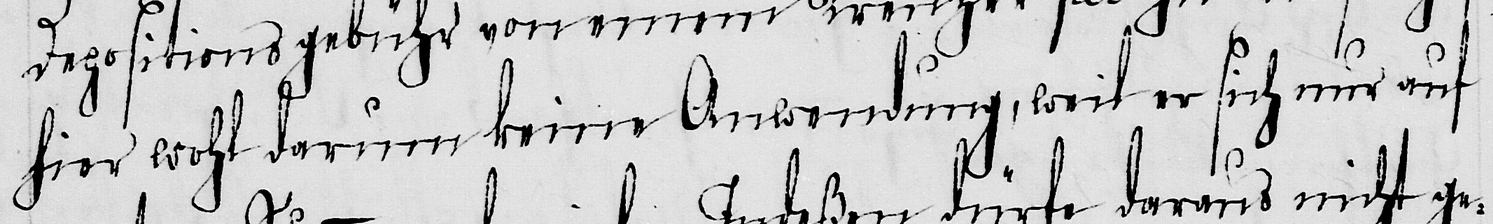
hier wohl darum keine Anwendung, weil er sich nur auf
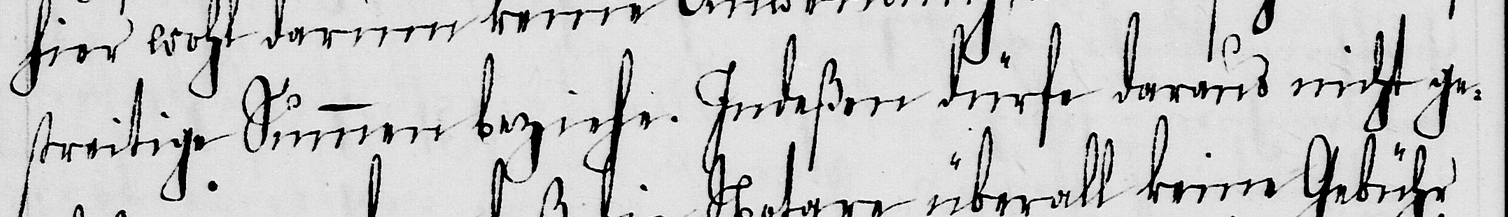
streitige Summen beziehe. Indeßen dürfe daraus nicht ge¬
